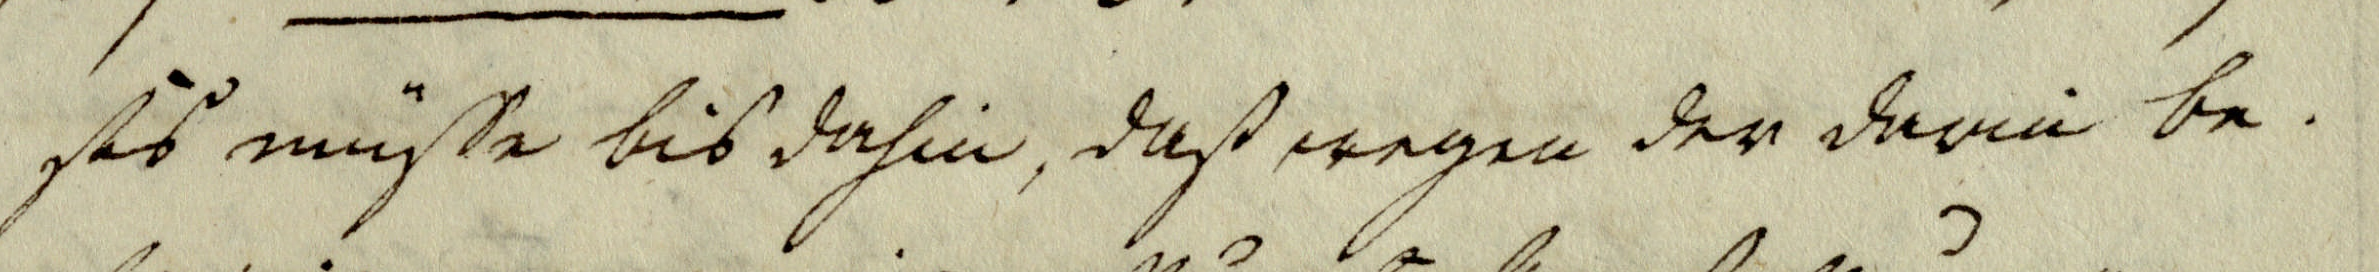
ses müsse bis dahin, daß wegen der darin be¬
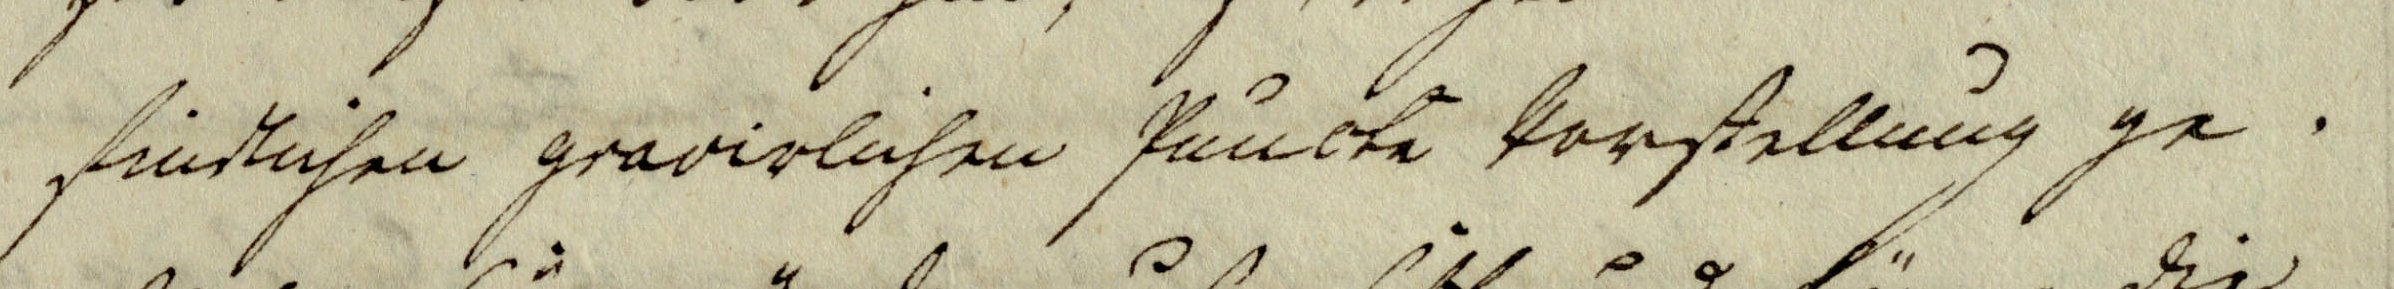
findlichen gravirlichen Puncte Vorstellung ge¬
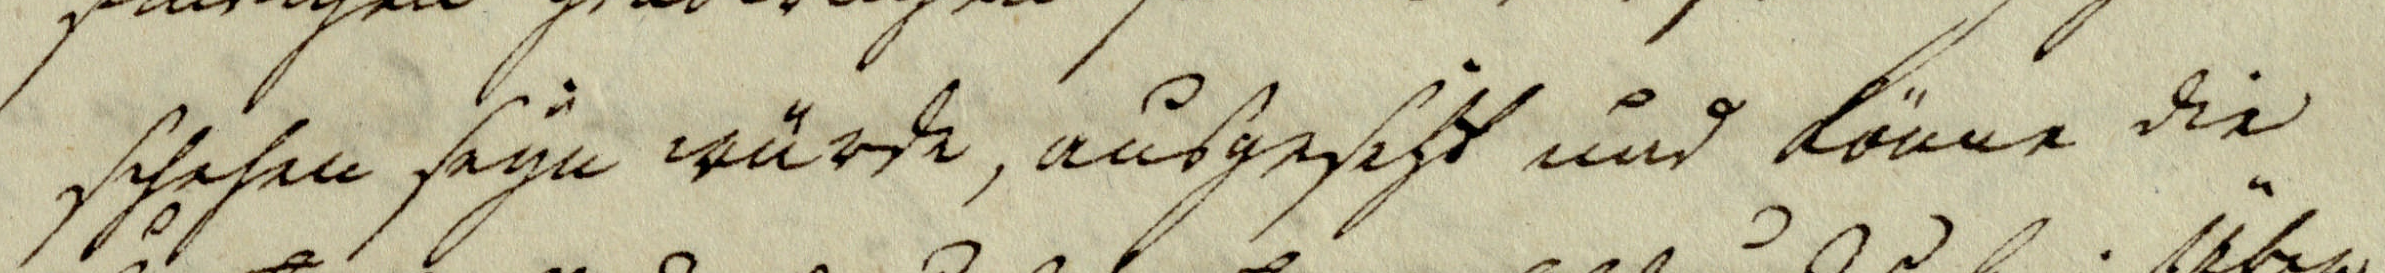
schehen seÿn würde, ausgesetzt und könne die
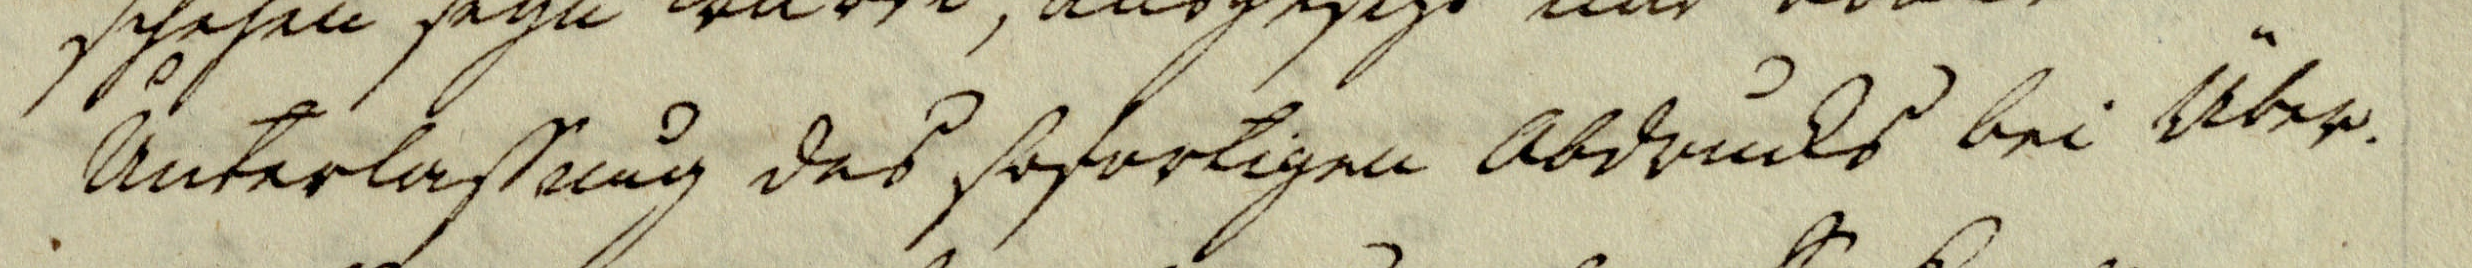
Unterlassung des sofortigen Abdrucks bei Über¬
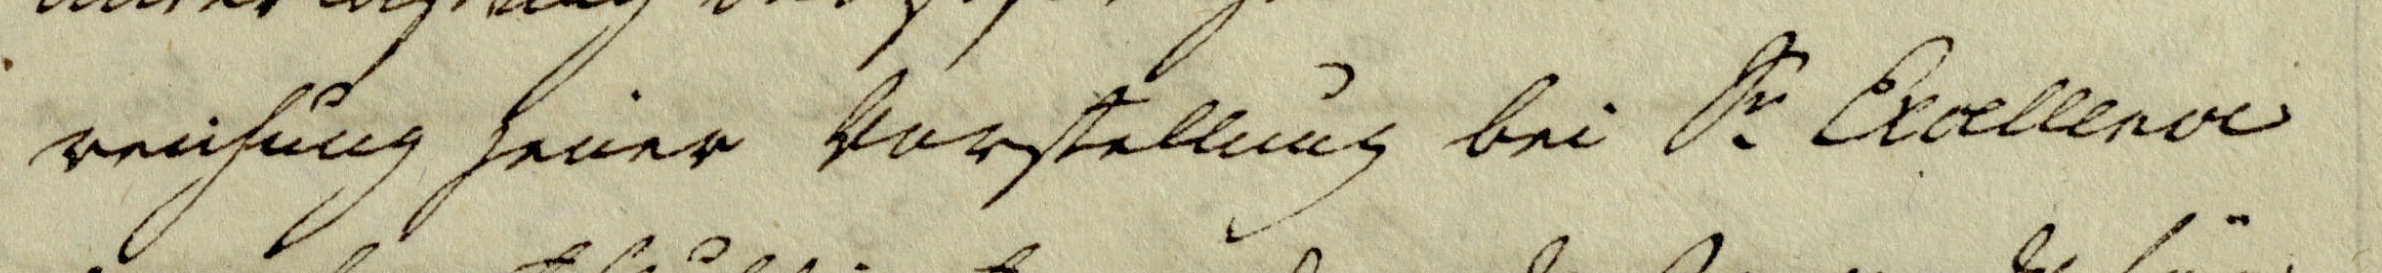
reichung seiner Vorstellung bei Sr Excellence
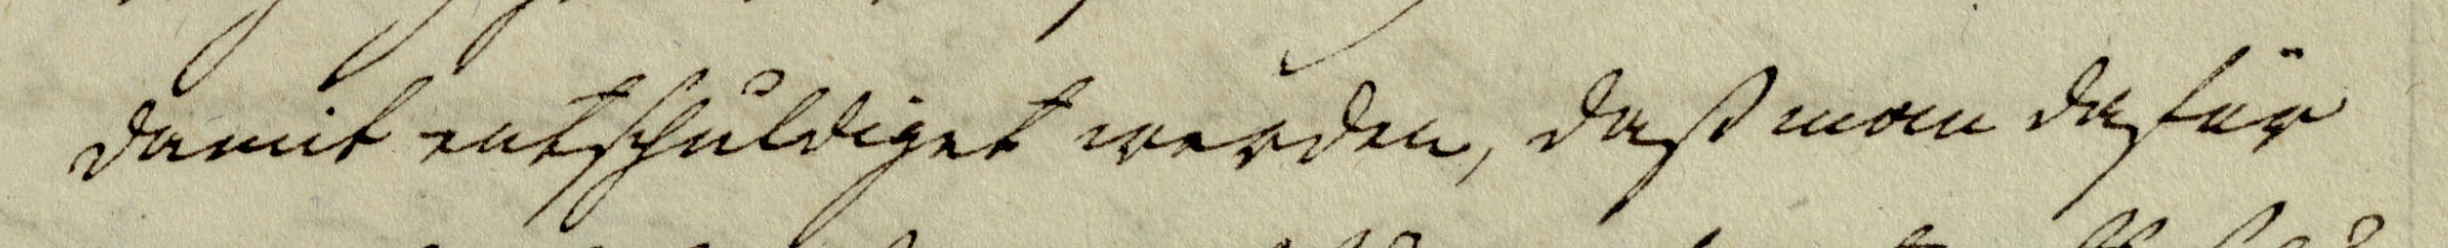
damit entschuldiget werden, daß man dafür
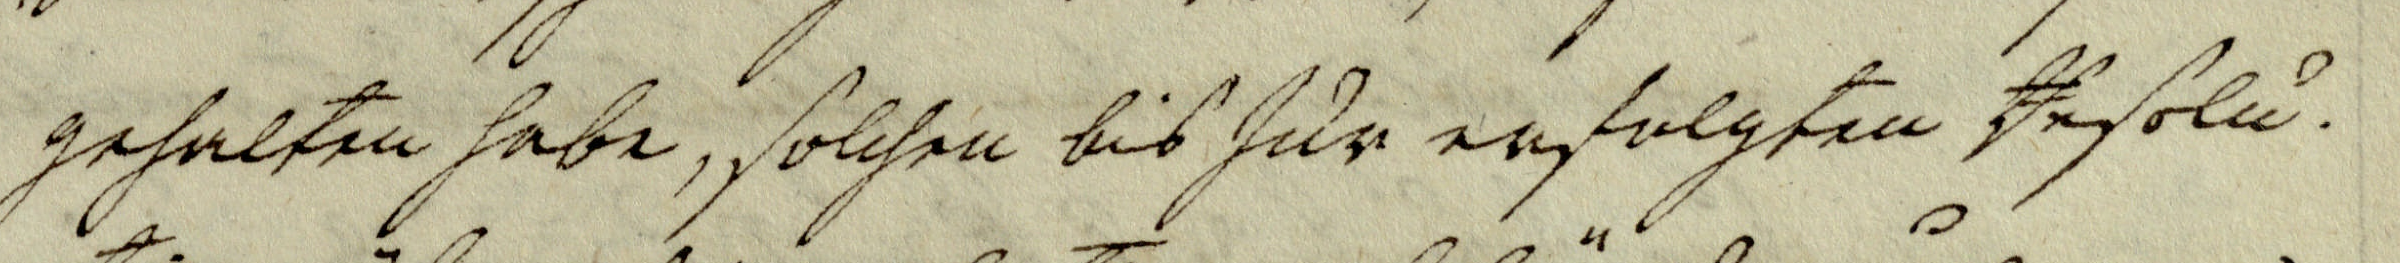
gehalten habe, solchen bis zur erfolgten Resolu¬
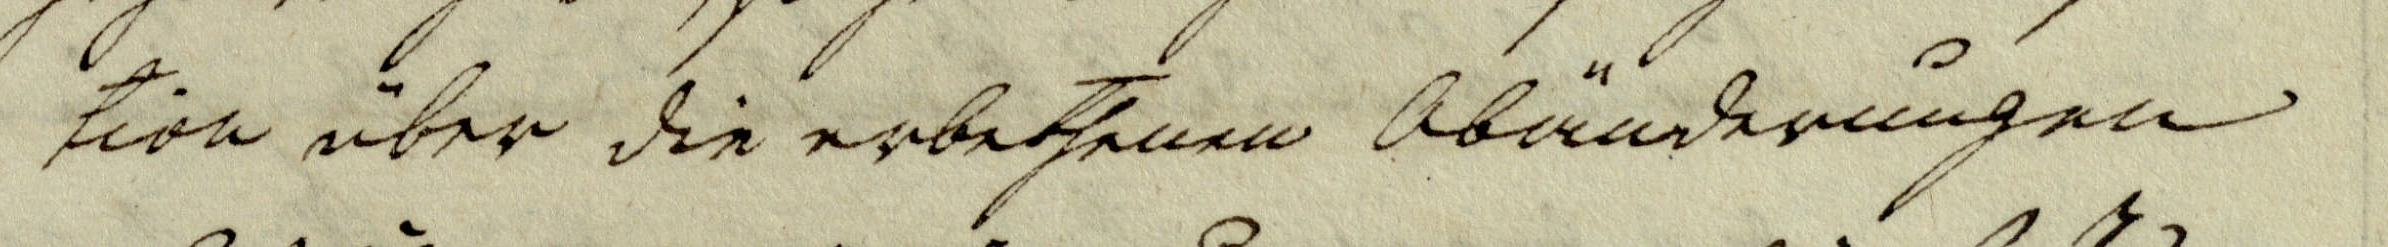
tion über die erbethenen Abänderungen
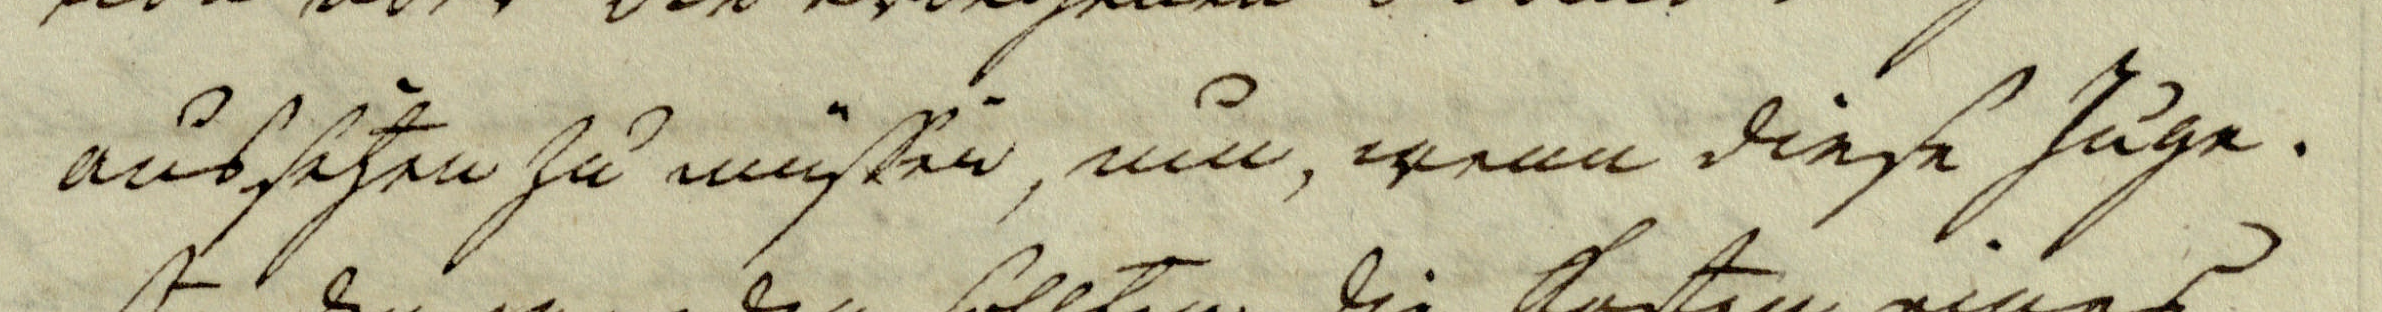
aussetzen zu müssen, um, wenn diese zuge¬
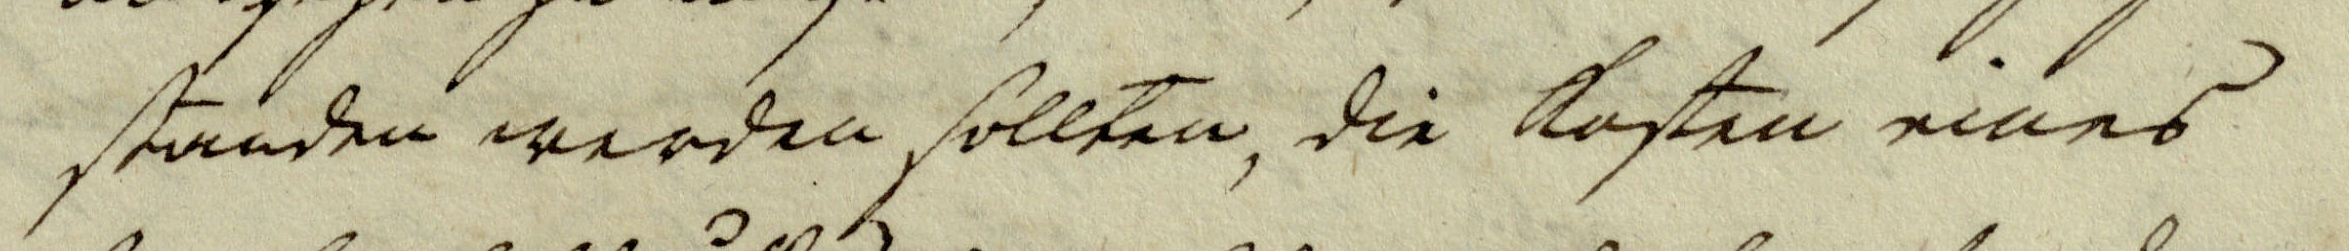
standen werden sollten, die Kosten eines
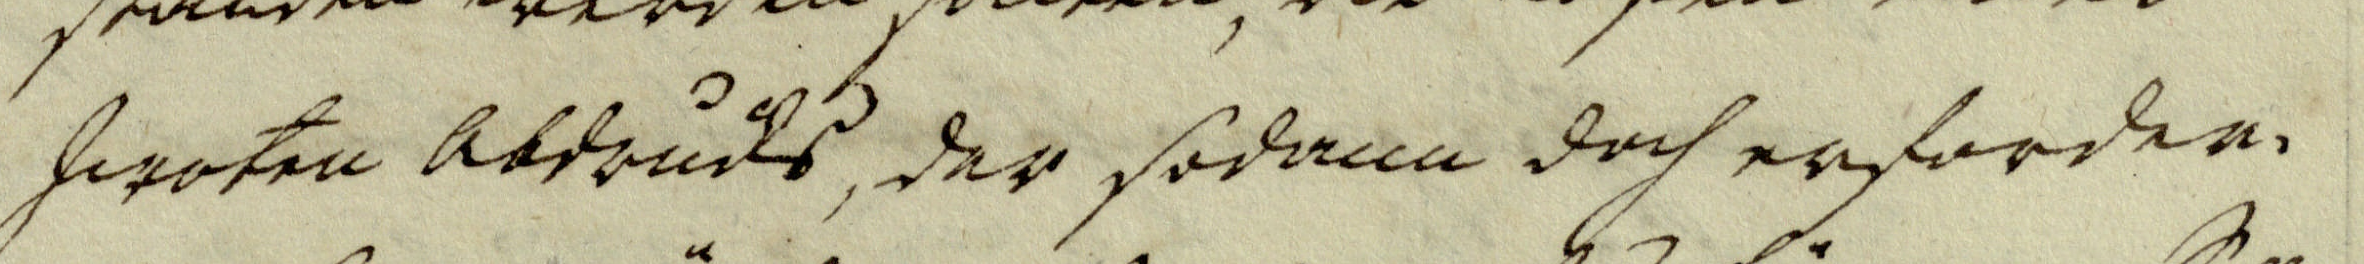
zwoten Abdrucks, der sodann doch erforder¬
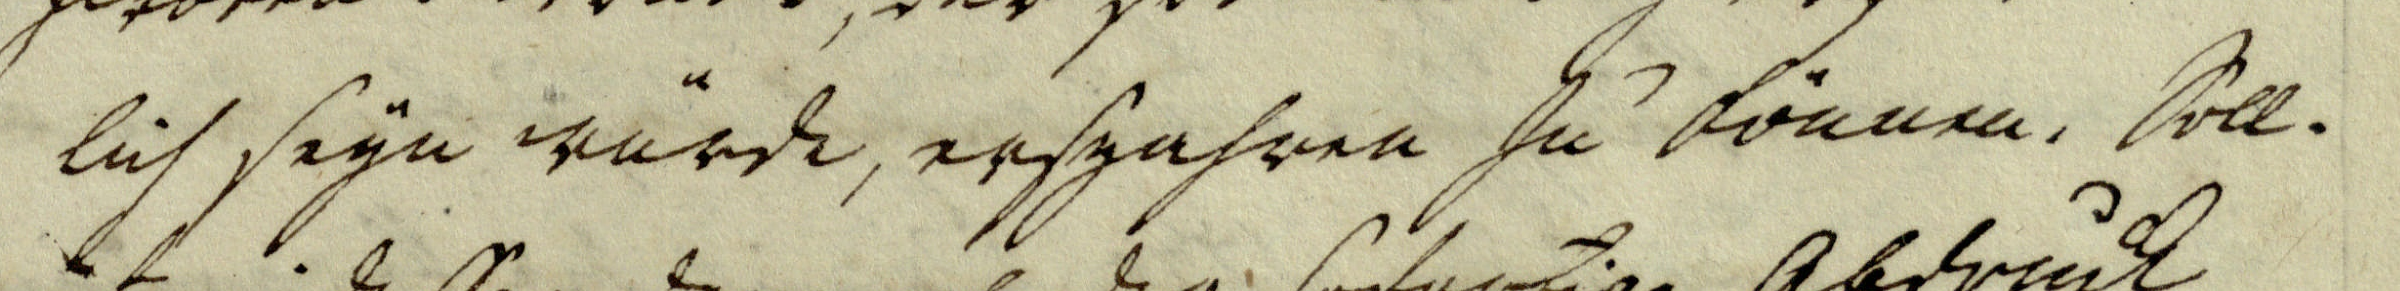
lich seÿn würde, erspahren zu können. Soll¬
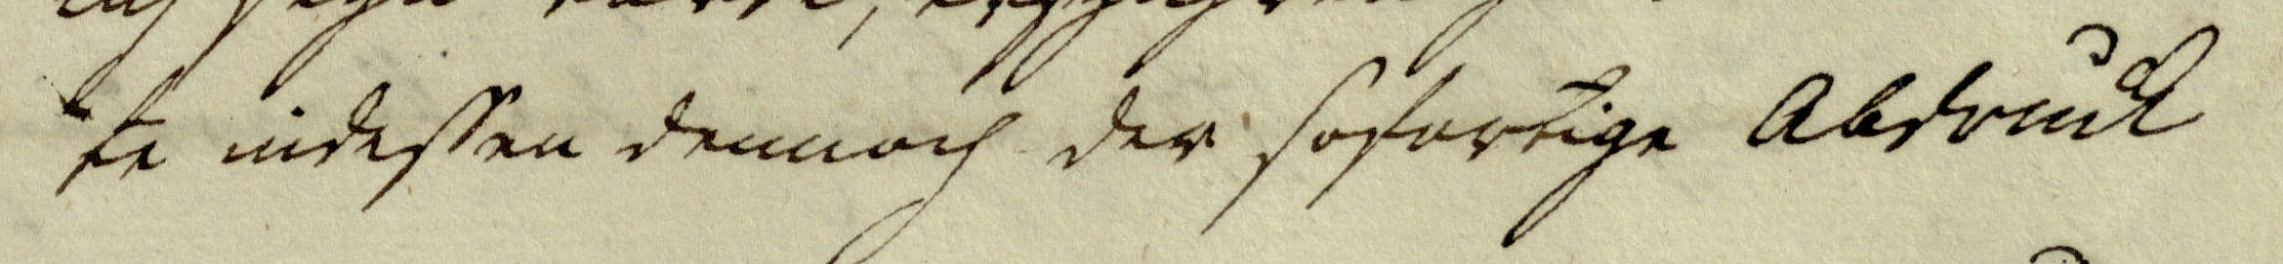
te indessen dennoch der sofortige Abdruck
